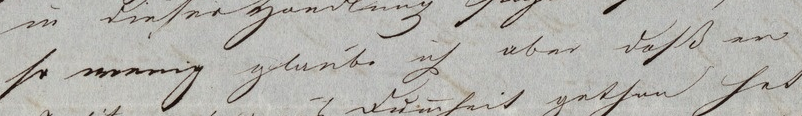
so wenig glaube ich aber daß er
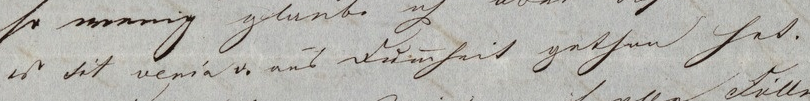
es sit venia v. aus Dummheit gethan hat.
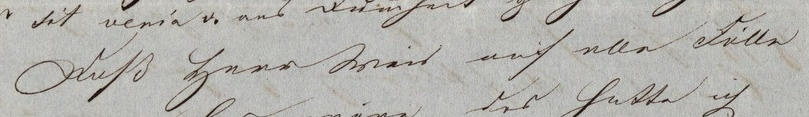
Daß Herr Weis auf alle Fälle
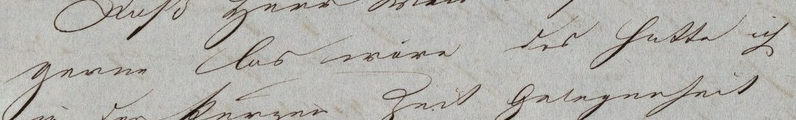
gerne los wäre das hatte ich
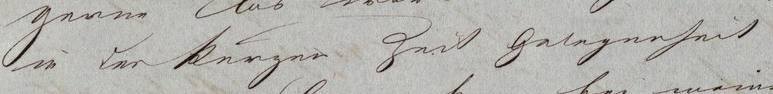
in der kurzen Zeit Gelegenheit
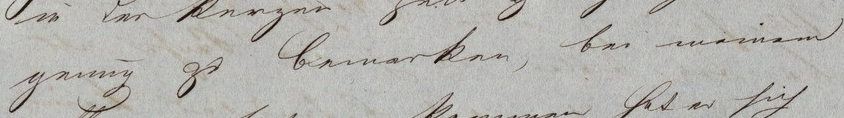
genug zu bemerken, bei meinem
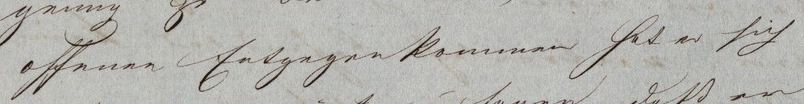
offenen Entgegenkommen hat er sich
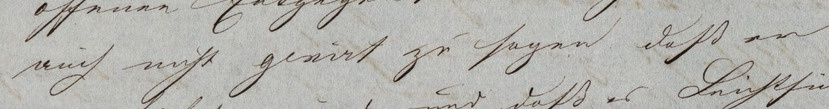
auch nicht genirt zu sagen daß er
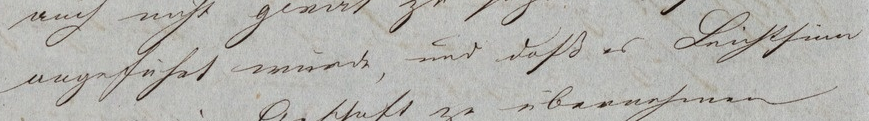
angeführt wurde, und daß es Leichtsinn
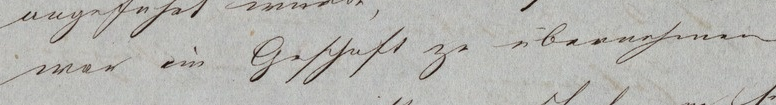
war ein Geschäft zu übernehmen
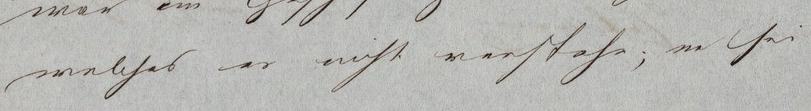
welches er nicht verstehe; er sei
